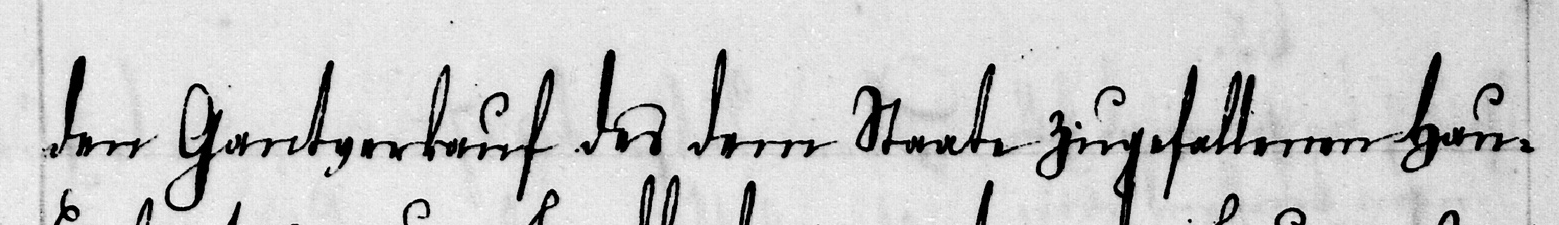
den Gantverkauf des dem Staate zugefallenen Hau¬
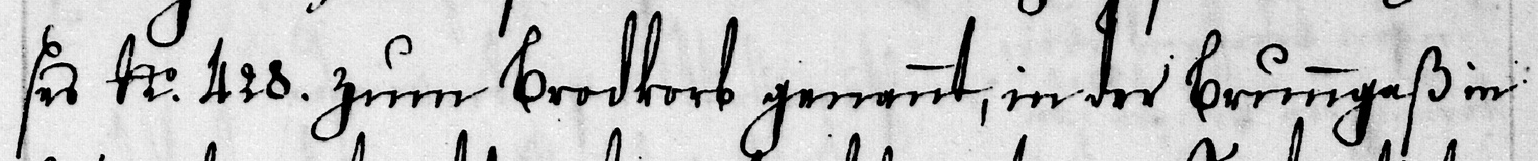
ses No. 428. zum Brodkorb genannt, in der Brunngaß in
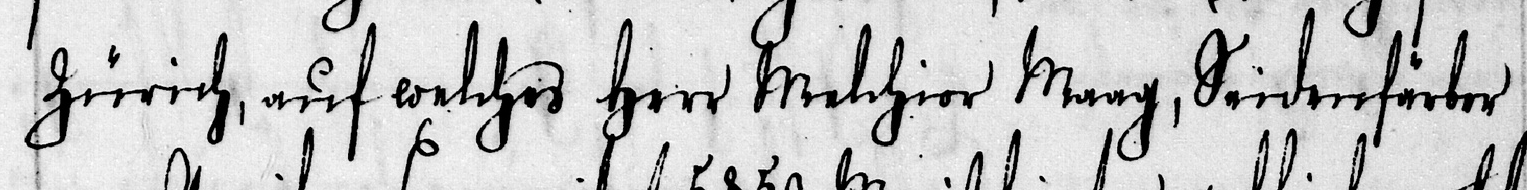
Zürich, auf welches Herr Melchior Maag, Seidenfärber
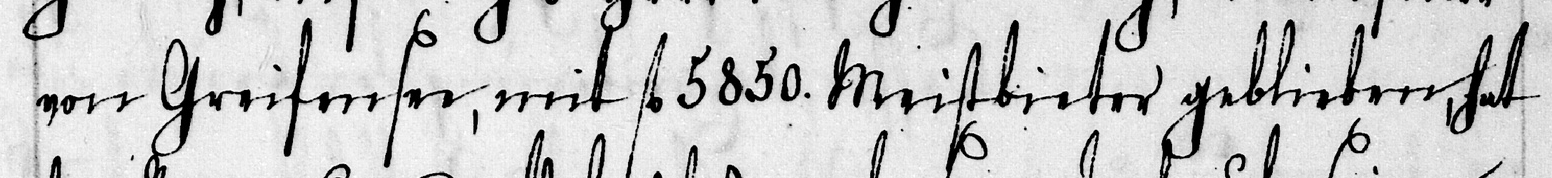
von Greifensee, mit fl 5850. Meistbieter geblieben, hat
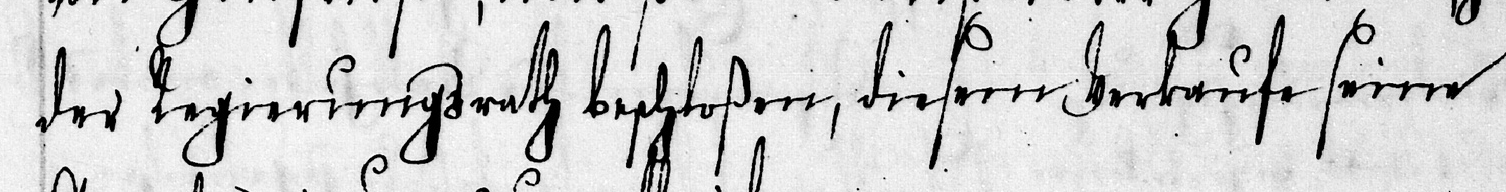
der Regierungsrath beschloßen, diesem Verkaufe seine
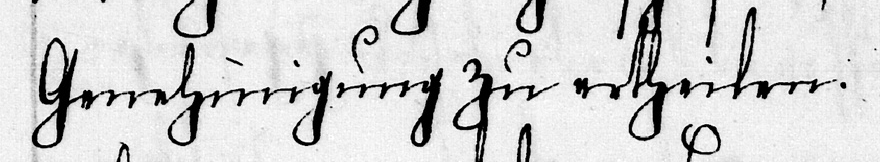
Genehmigung zu ertheilen.
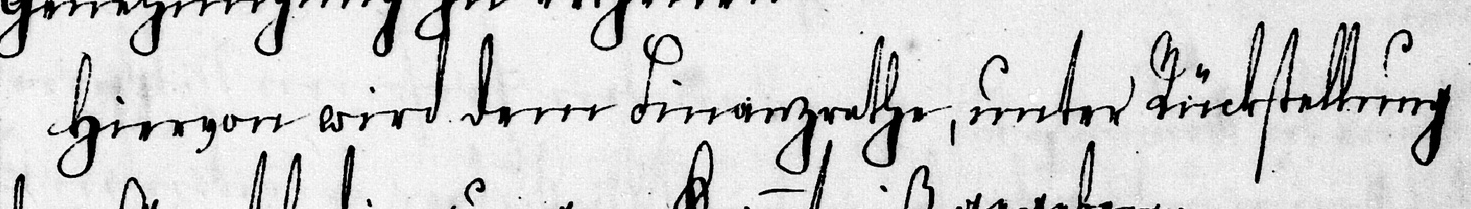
Hiervon wird dem Finanzrathe, unter Rückstellung
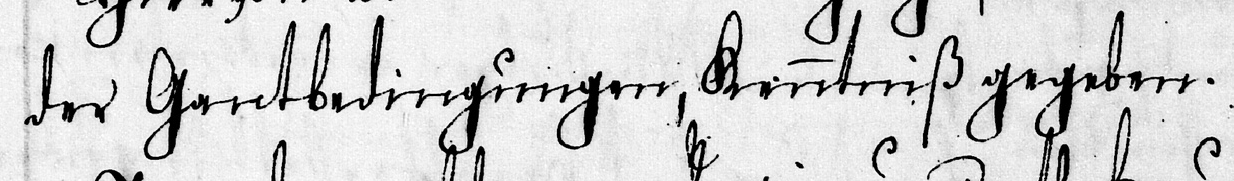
der Gantbedingungen, Kenntniß gegeben.
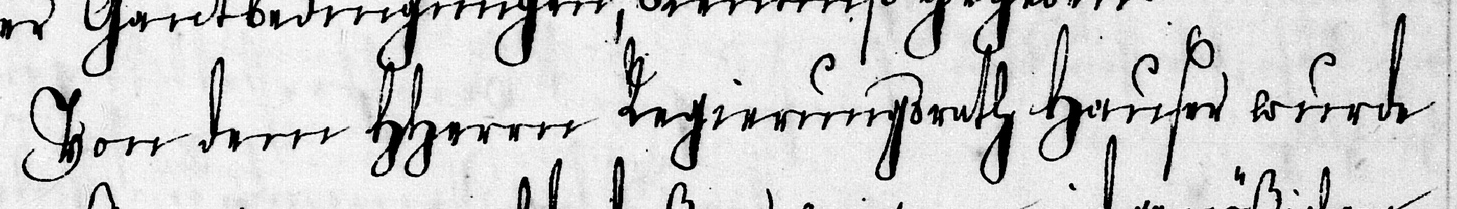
Von dem HHerrn Regierungsrath Hauser wurde
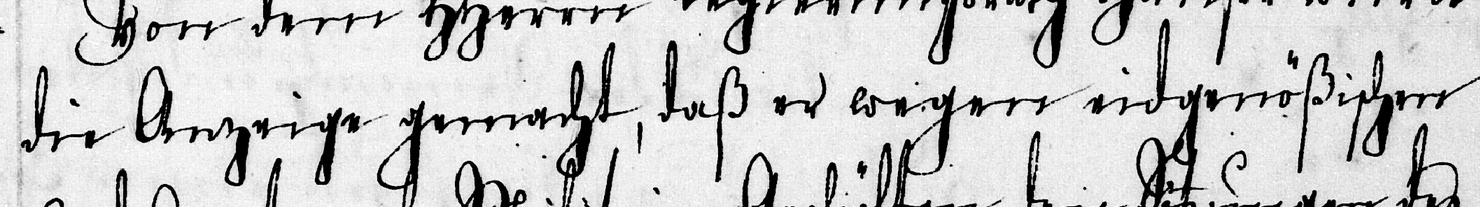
die Anzeige gemacht, daß er wegen eidgenößischen
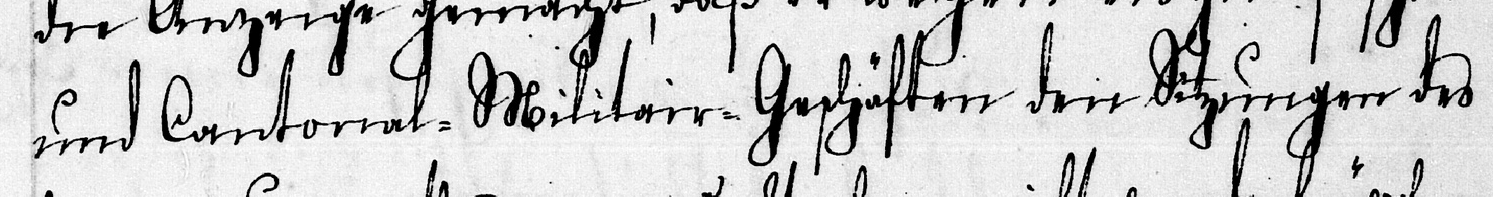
und Cantonal-Militair-Geschäften den Sitzungen des
